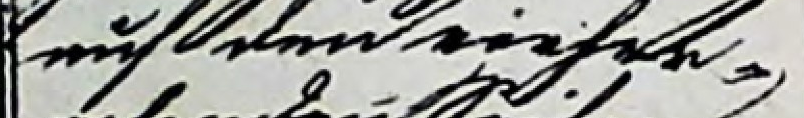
auf den einher„
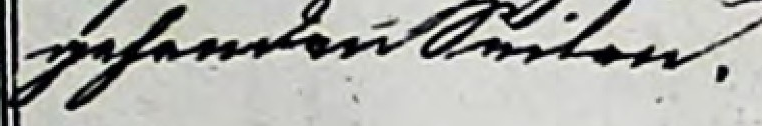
gehenden Seiten.
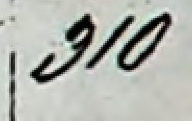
310
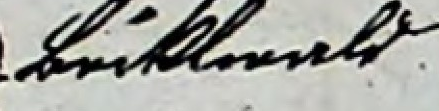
Bucklwald
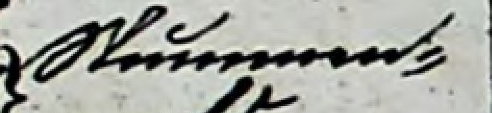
Stummen„
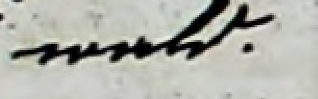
wald.
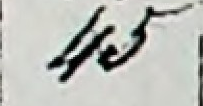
45
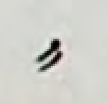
„
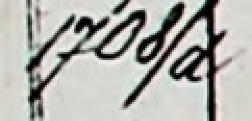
1708/d
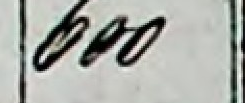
600
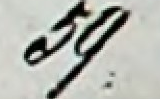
59
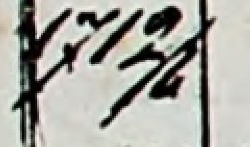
1712/b
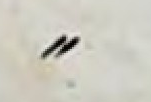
„
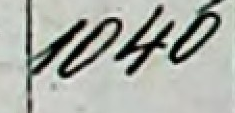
1046
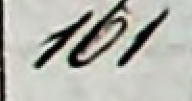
161
